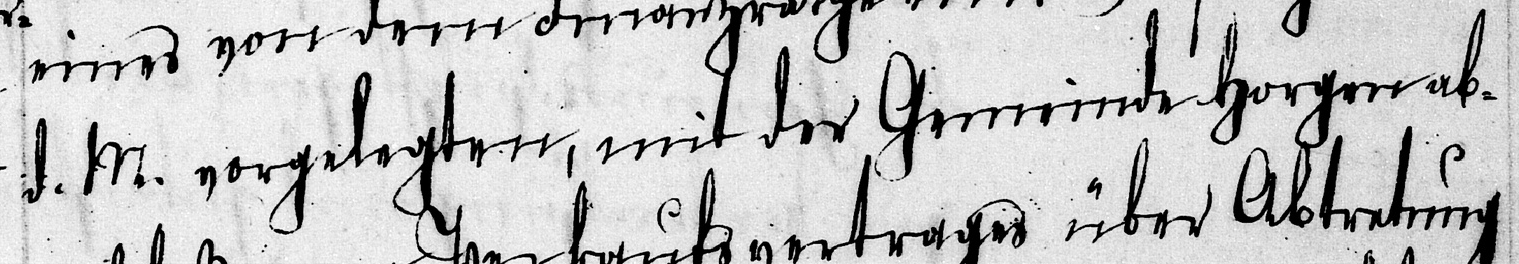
d. M. vorgelegten, mit der Gemeinde Horgen ab¬
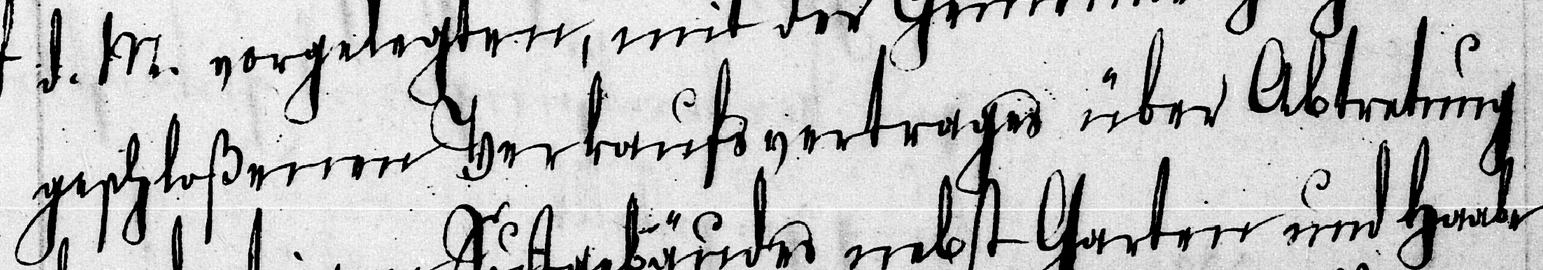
geschloßenen Verkaufsvertrages über Abtretung
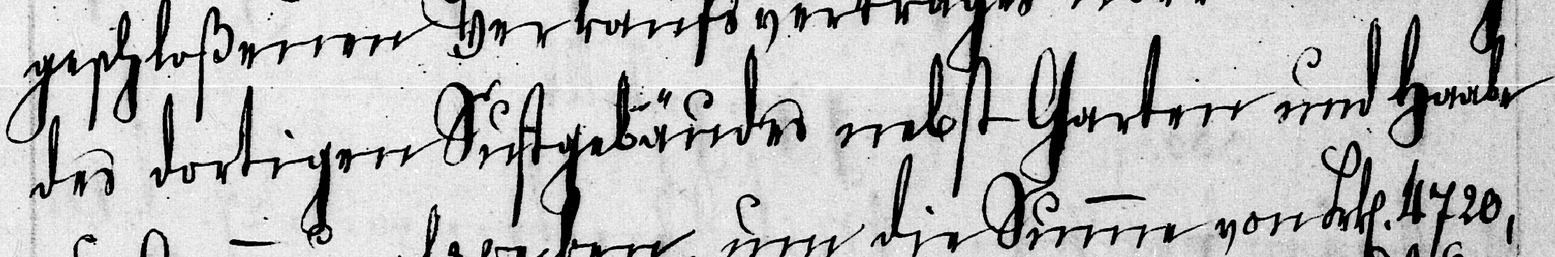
des dortigen Sustgebäudes nebst Garten und Haabe
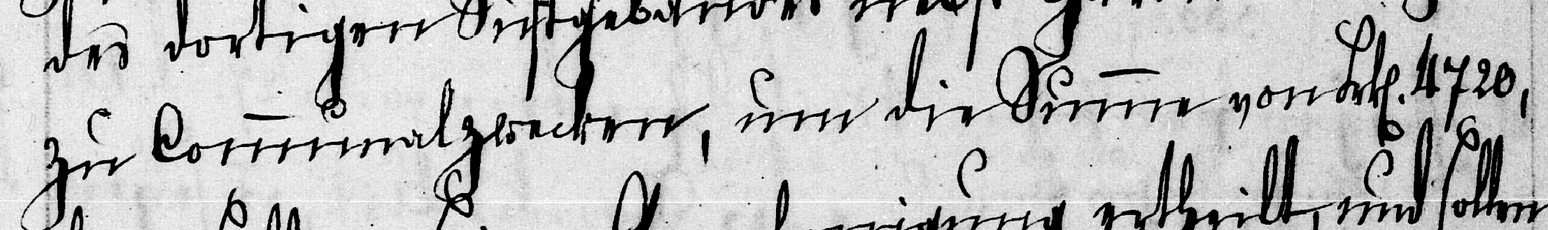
zu Communalzwecken, um die Summe von Frk[en]. 4720,
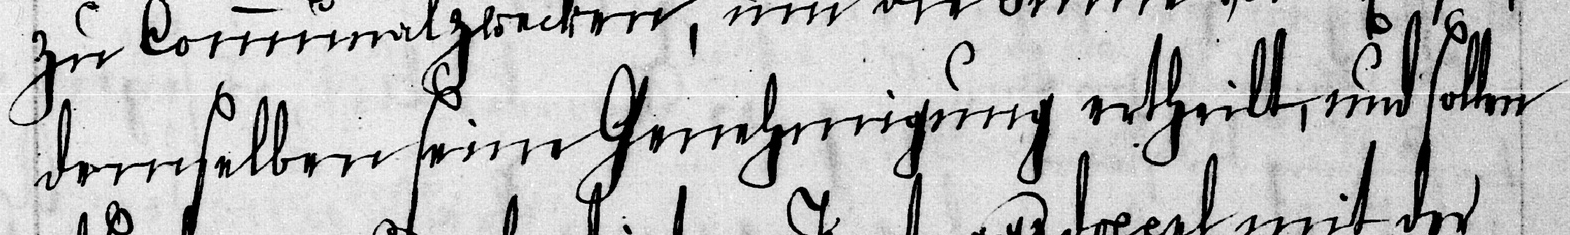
demselben seine Genehmigung ertheilt, und sollen
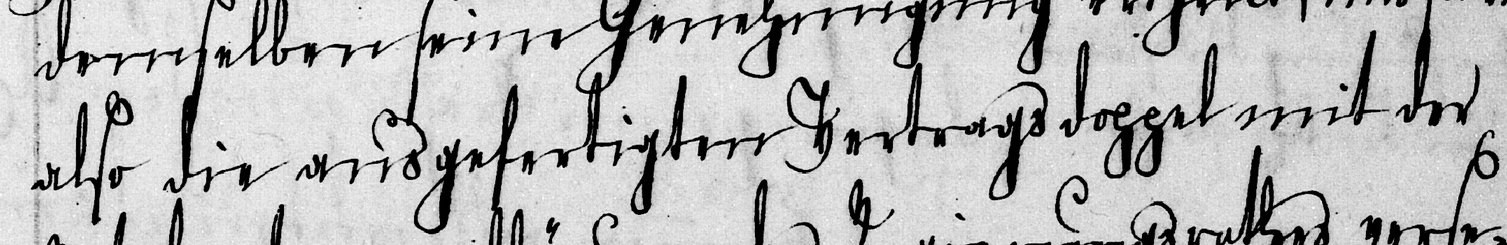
also die ausgefertigten Vertragsdoppel mit der
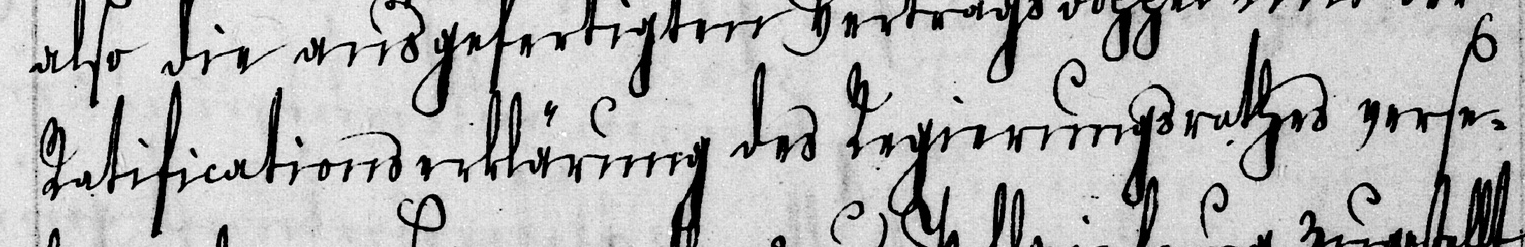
Ratificationserklärung des Regierungsrathes verse¬
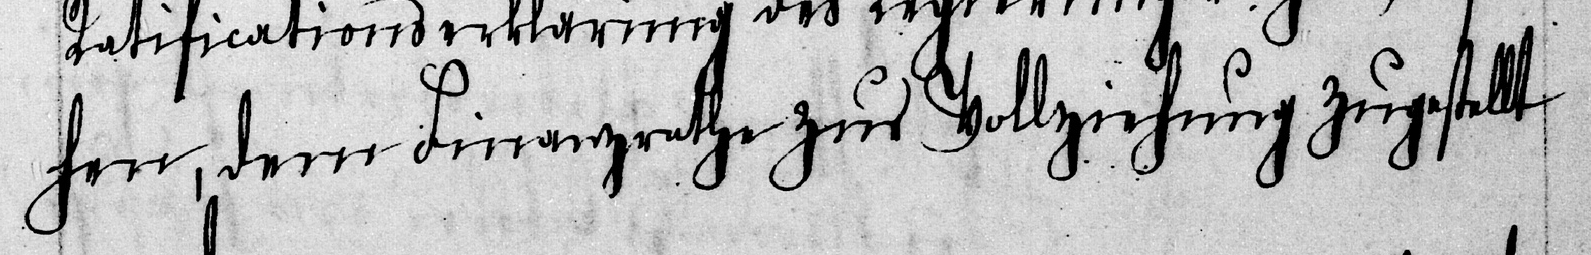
hen, dem Finanzrathe zur Vollziehung zugestel¬
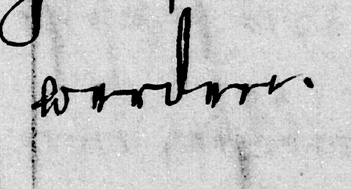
werden.
